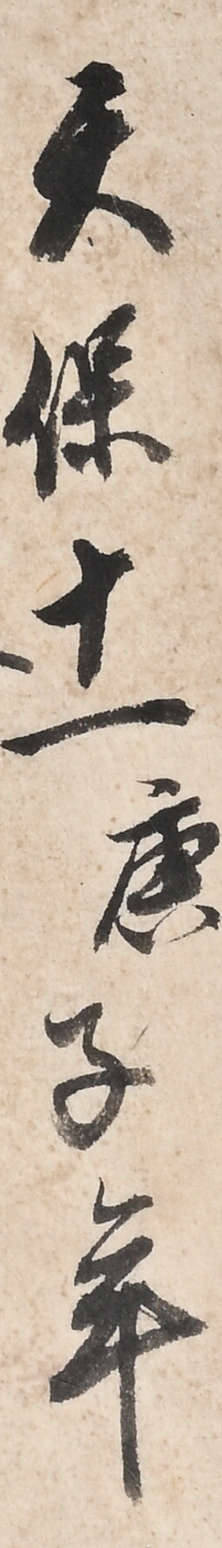天保十一庚子年
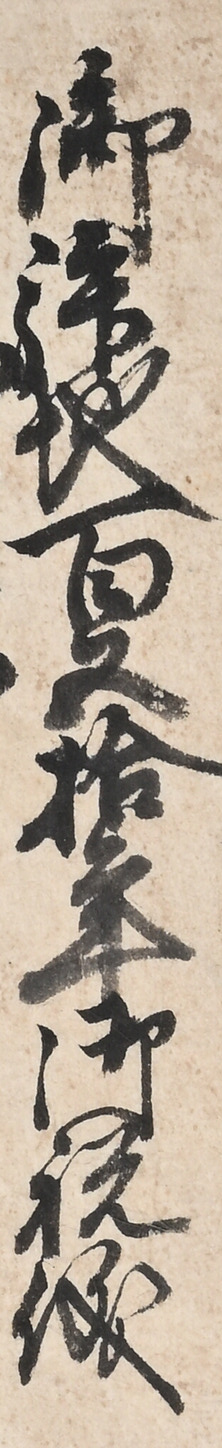御拝地百五拾年御祝儀
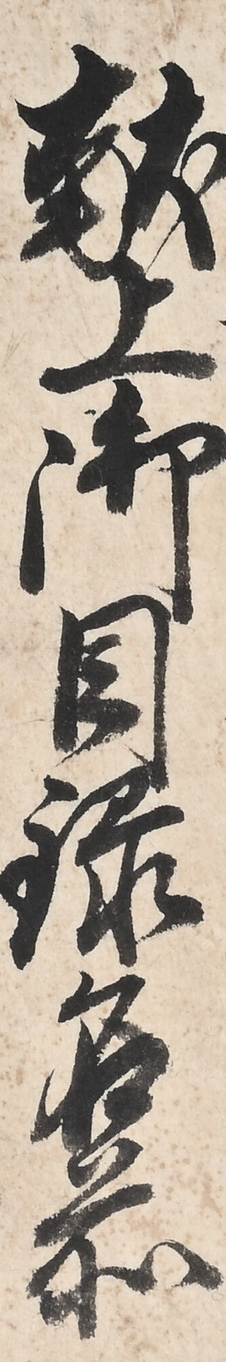献上御目録名前

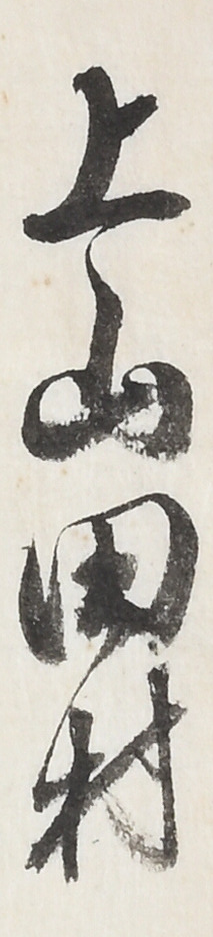上山田村
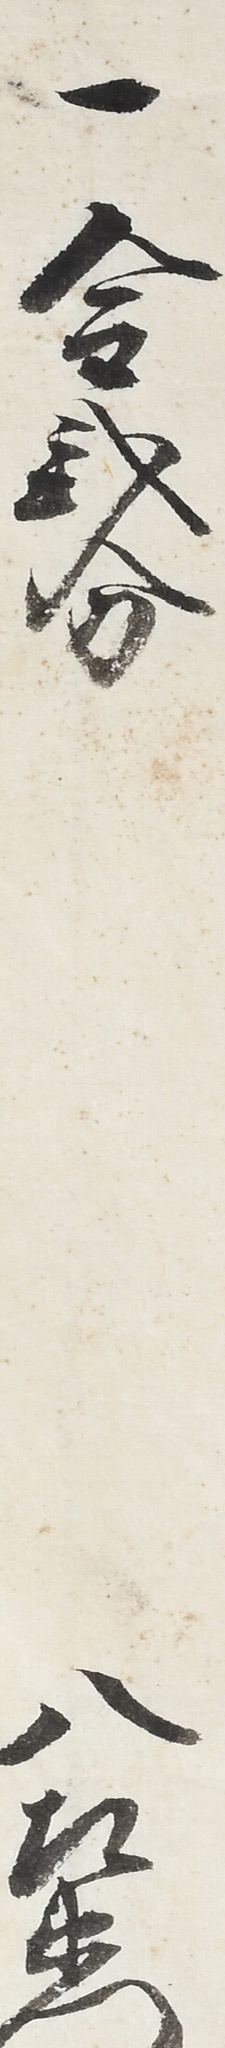一金弐分八左衛門

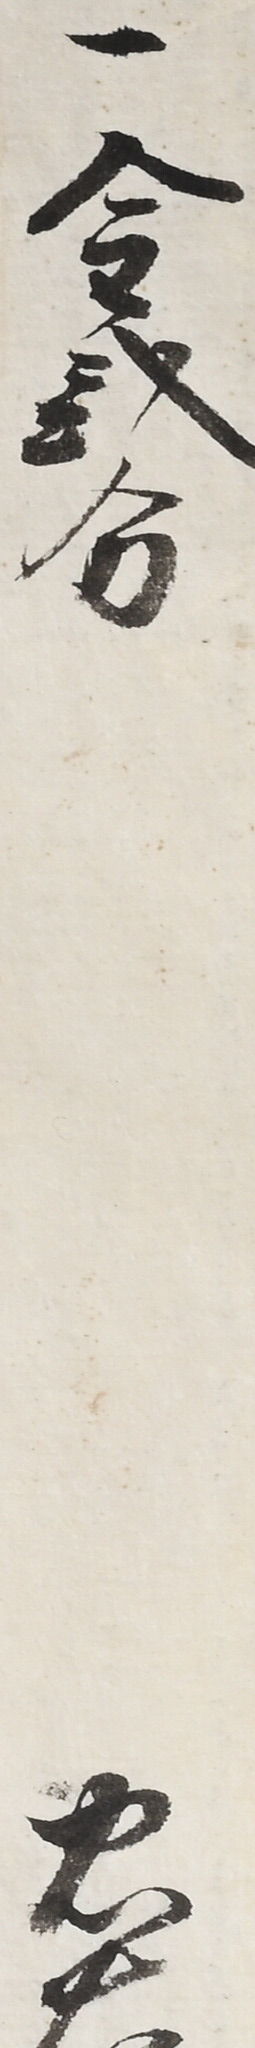一金弐分忠右衛門
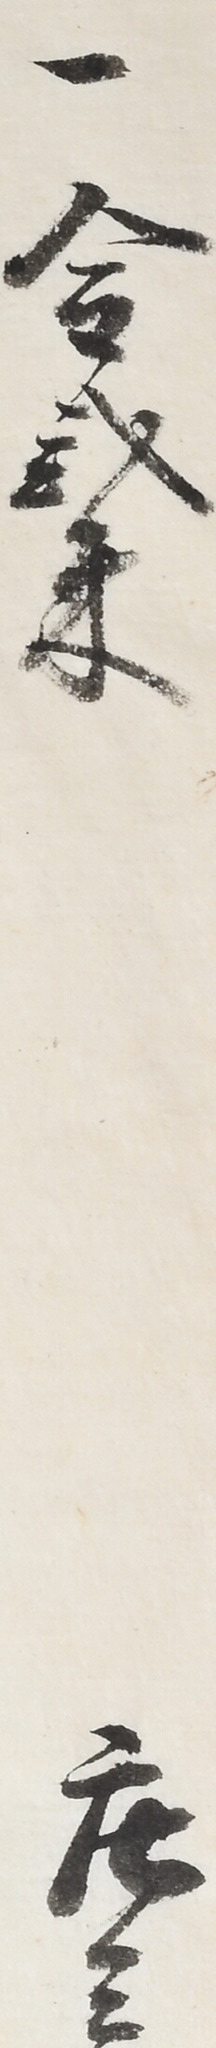一金弐朱庄兵衛
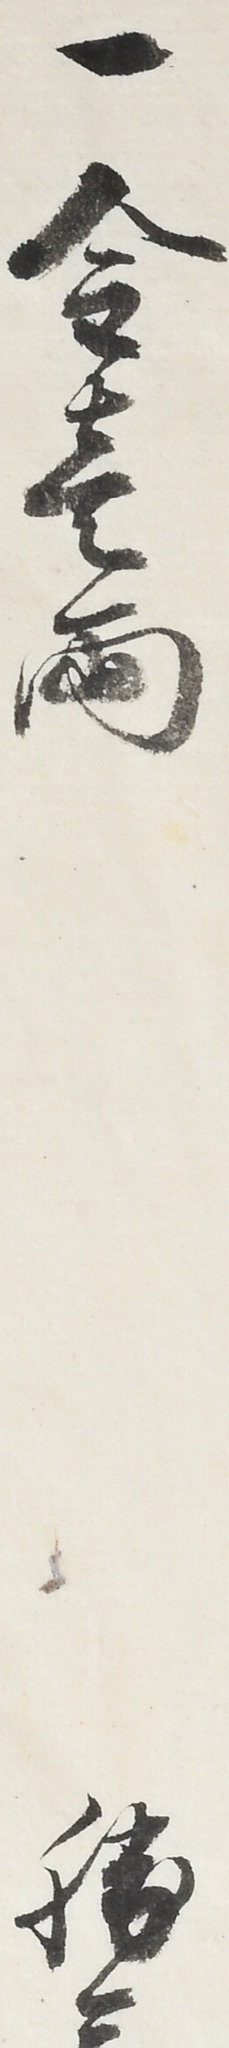一金壱両勝兵衛

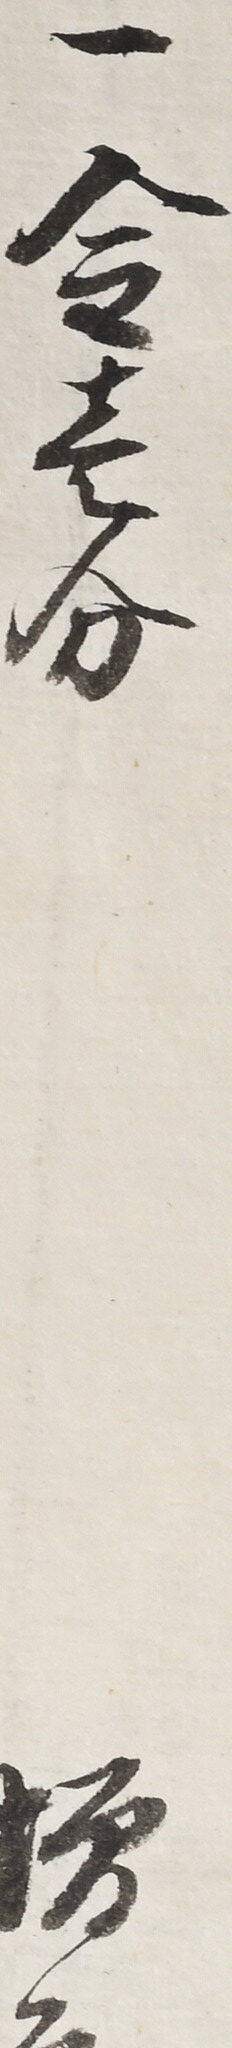一金壱分増蔵
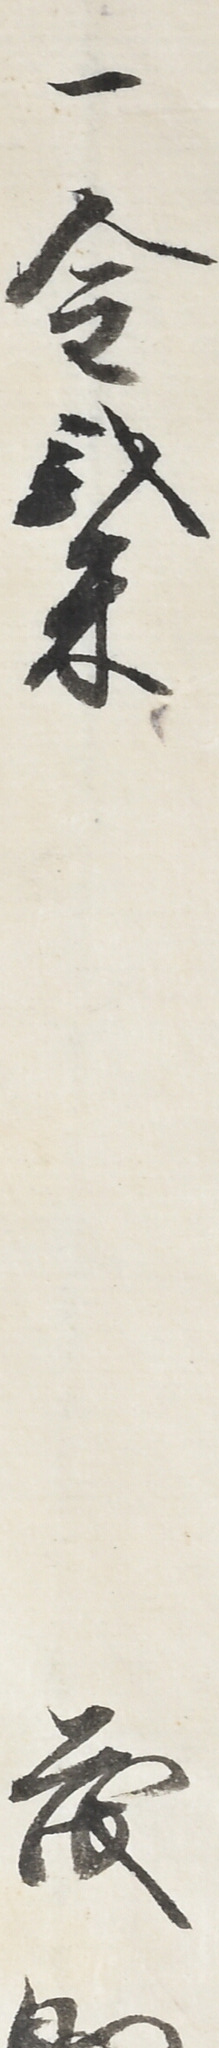一金弐朱茂助

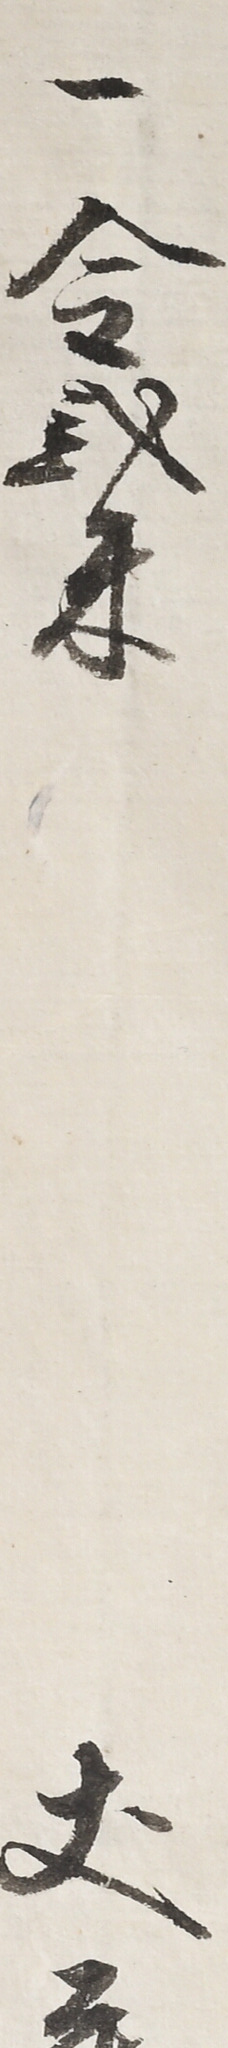一金弐朱丈蔵
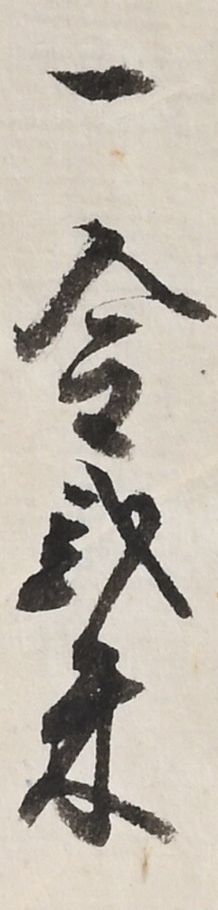一金弐朱丈蔵
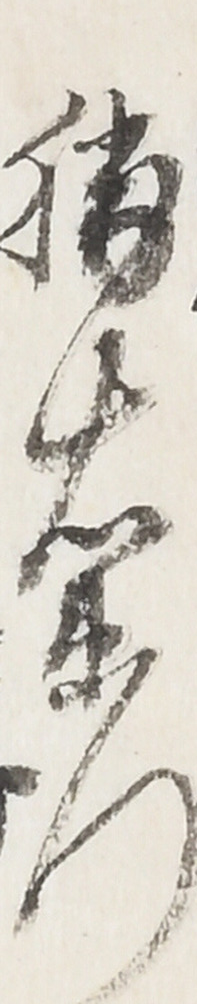勝右衛門
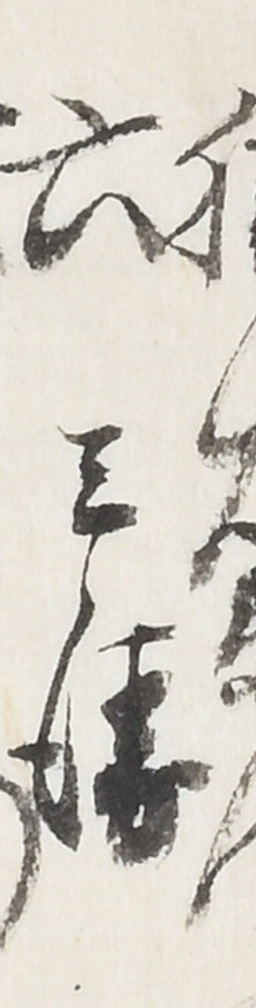六兵衛
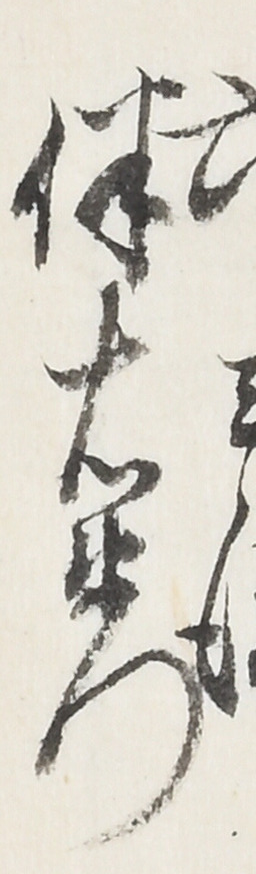伴右衛門
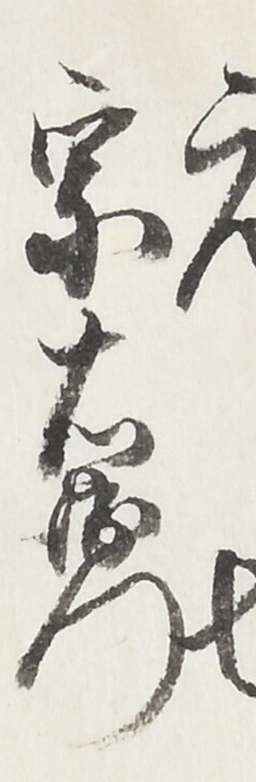宗右衛門
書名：御拝地百五拾年御祝儀献上御目録名前
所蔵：伊那市立高遠町図書館・合同会社AMANE
